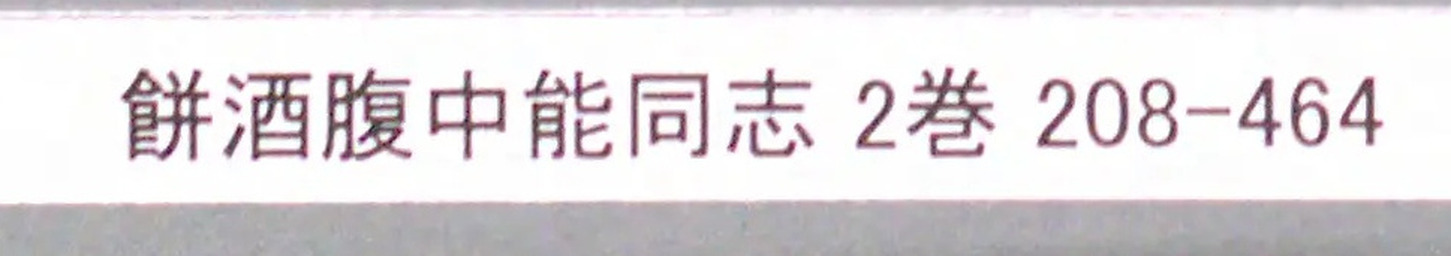餅酒腹中能同志完

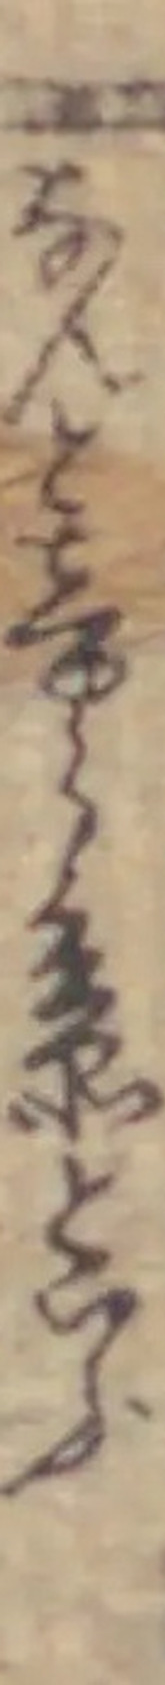なんとしやう兵衛といふ
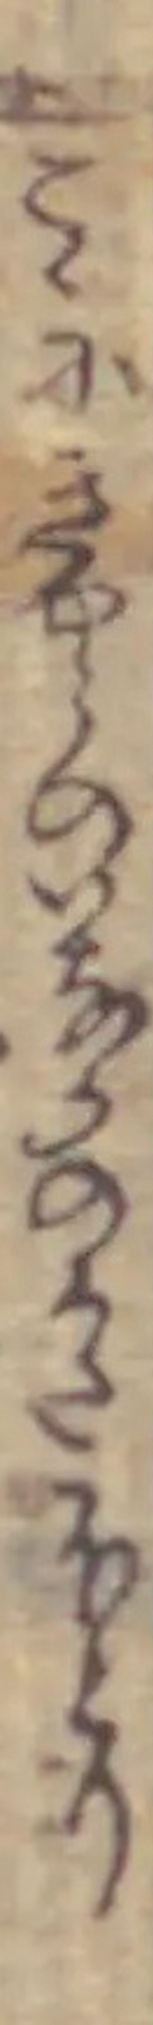こゝにきやうのいなかのかたほとり
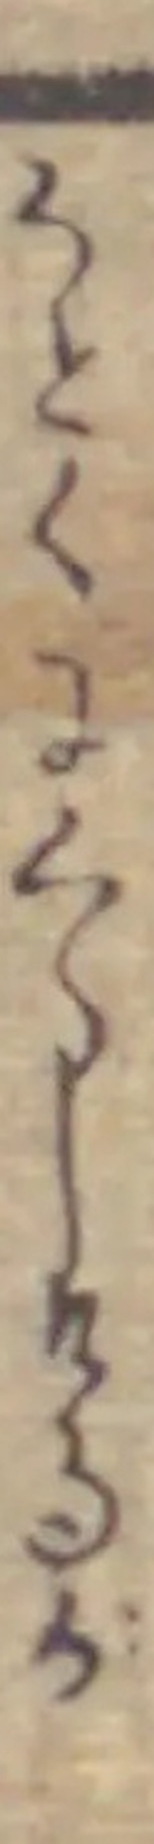うとくにくらしけるが
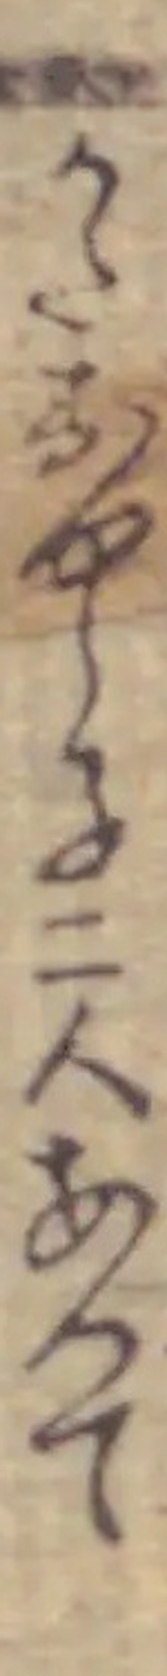かたおやし子二人あつて
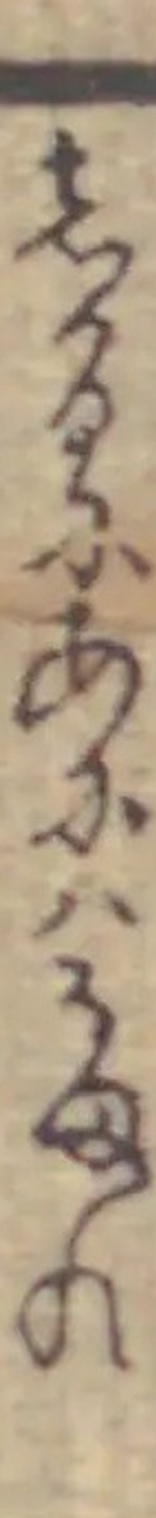しかるにあにはうまれ
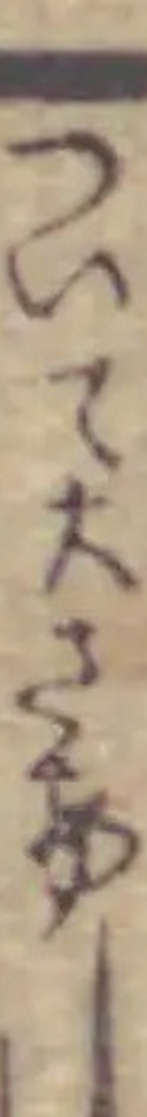ついて大さけ
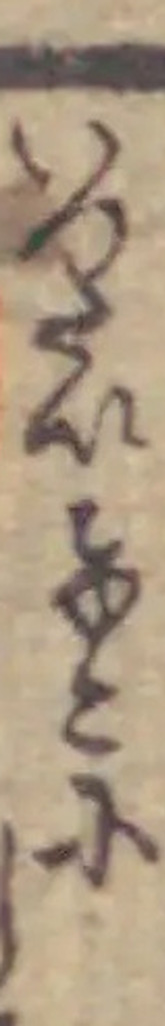いつさいけこにして
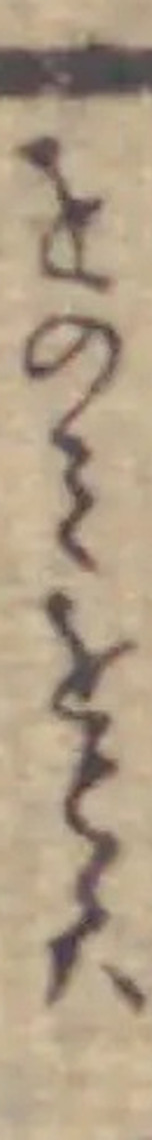をのみをとゝは
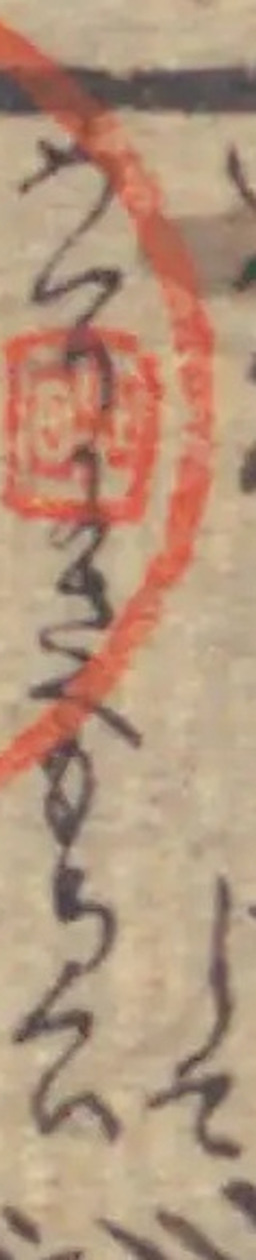めくりにさへもちくい
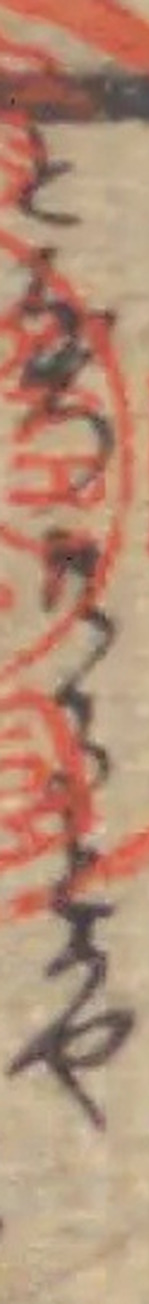となつけるとかや
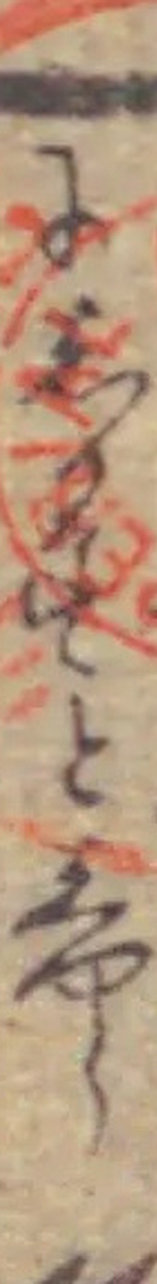にしかすとしやう
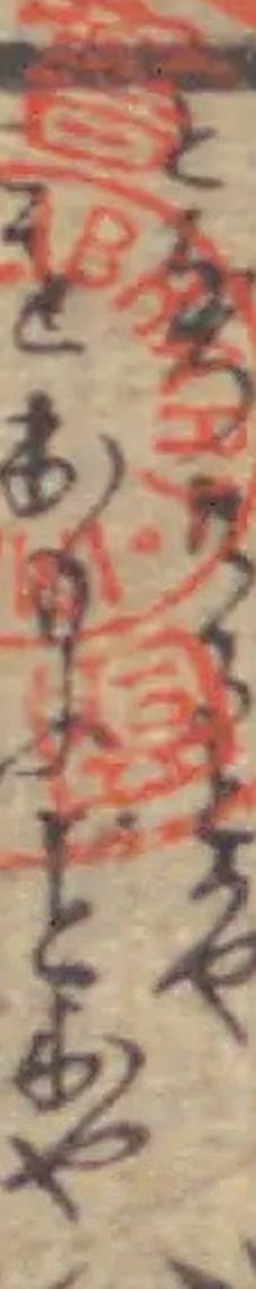こをおもふことおや
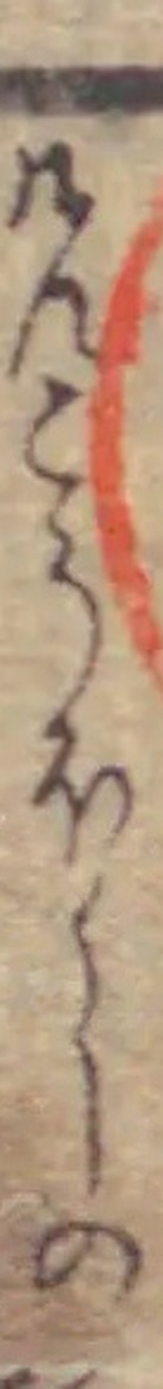けんこうほうしの
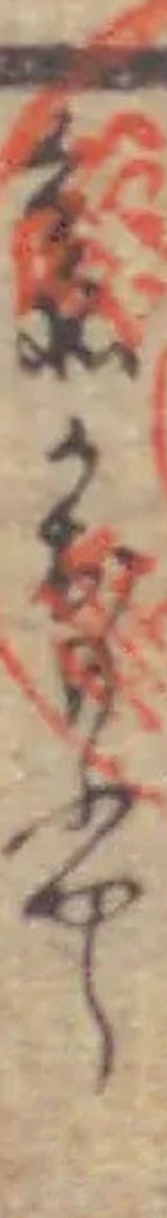兵衛かおもふやら
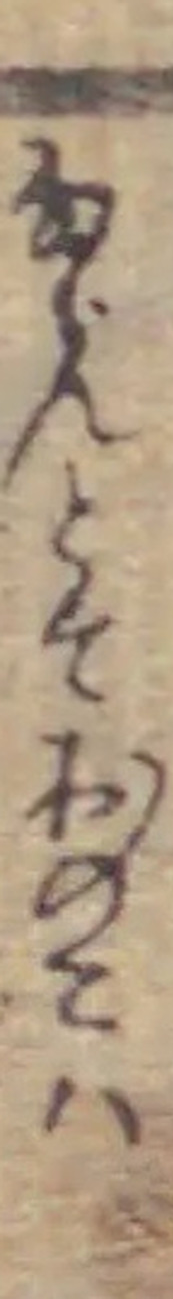ならんとそおのこは
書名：餅酒腹中能同志 2巻
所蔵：国立国会図書館 National Diet Library, JAPAN
